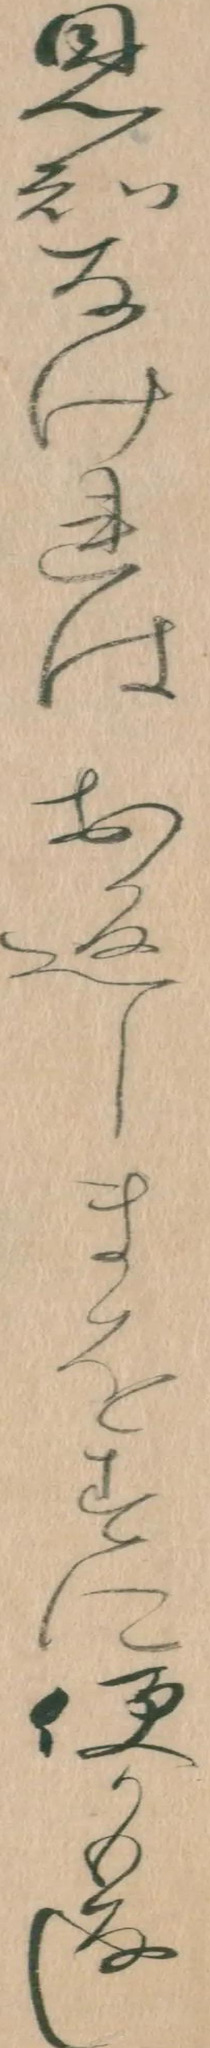見知なけれはお返しまをすに便りもなし
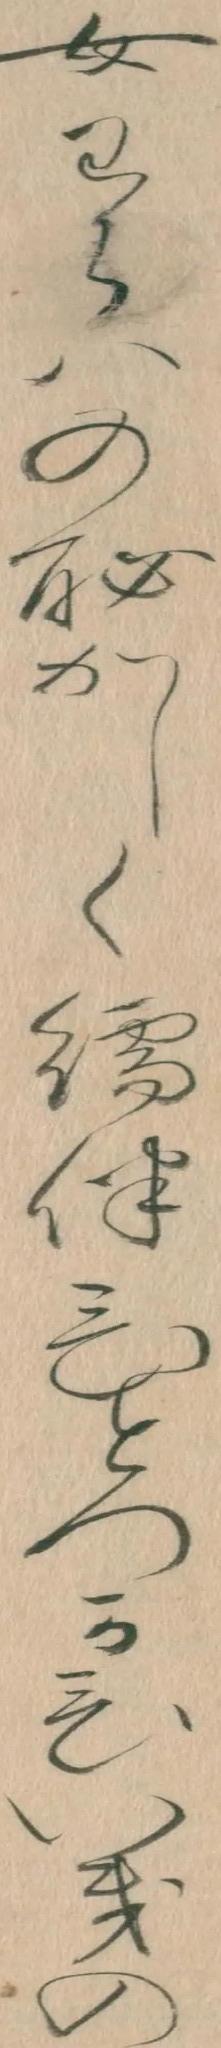女わらはの恥かしく襦袢ひとつかひいきの
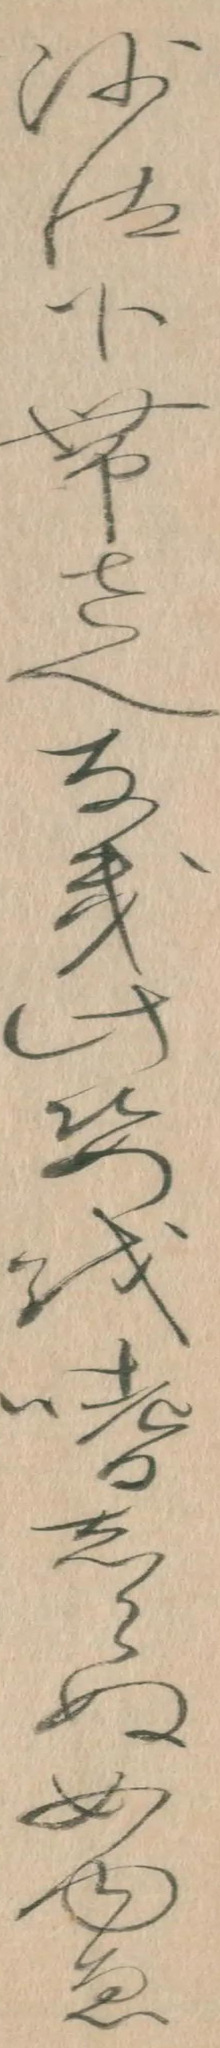沙汰下帯さへなき此姿を嗜しらぬ女ゆゑ
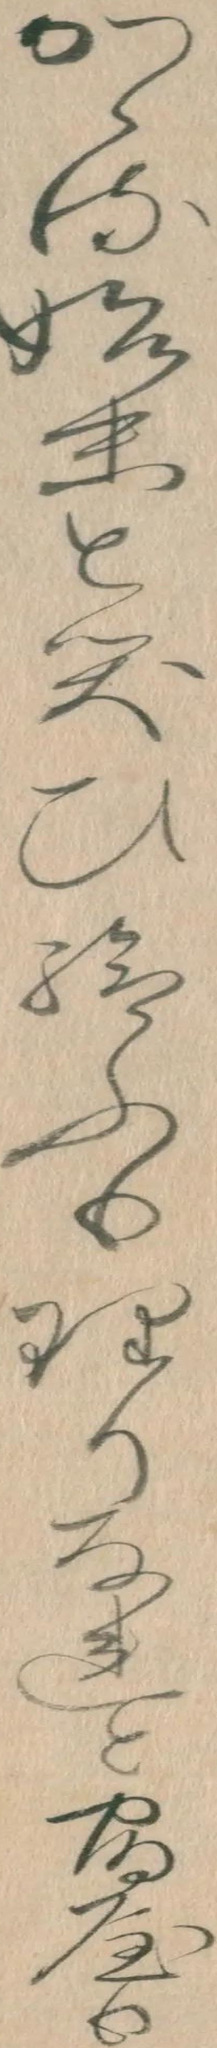かゝる始末と笑ひ給ふも理りなれと宿屋も
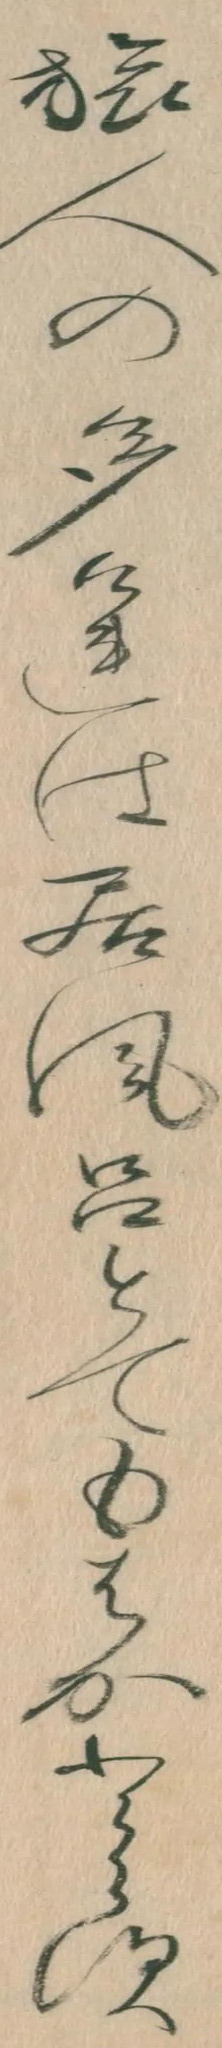旅人の多けれは居風呂とてもはかとらす
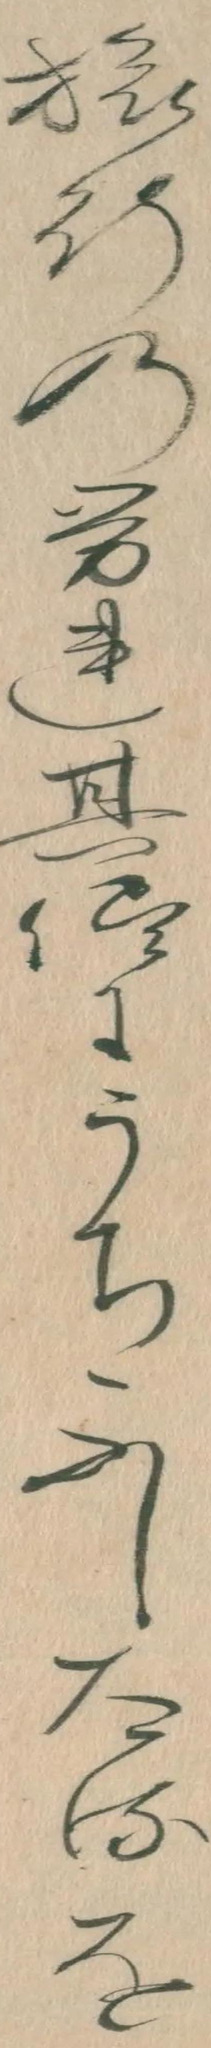旅行の労れ其侭にうちふしたるを
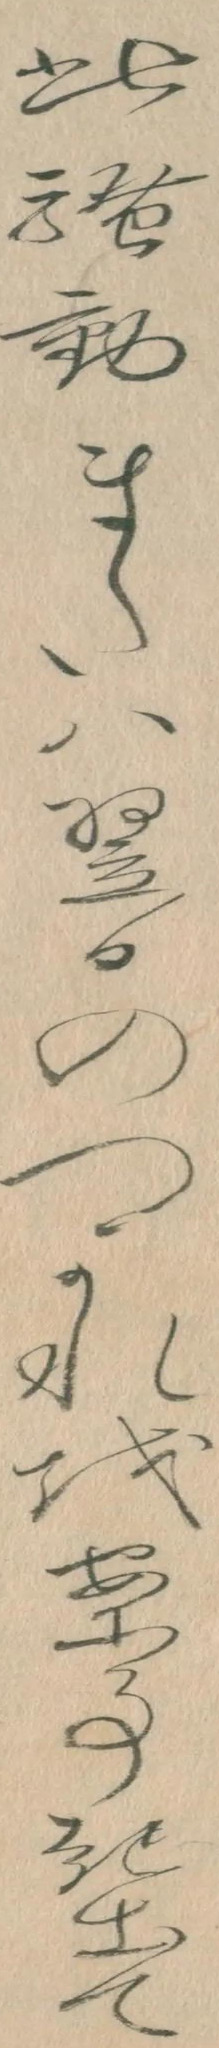此騒動または翌日のつかれを案し起出て
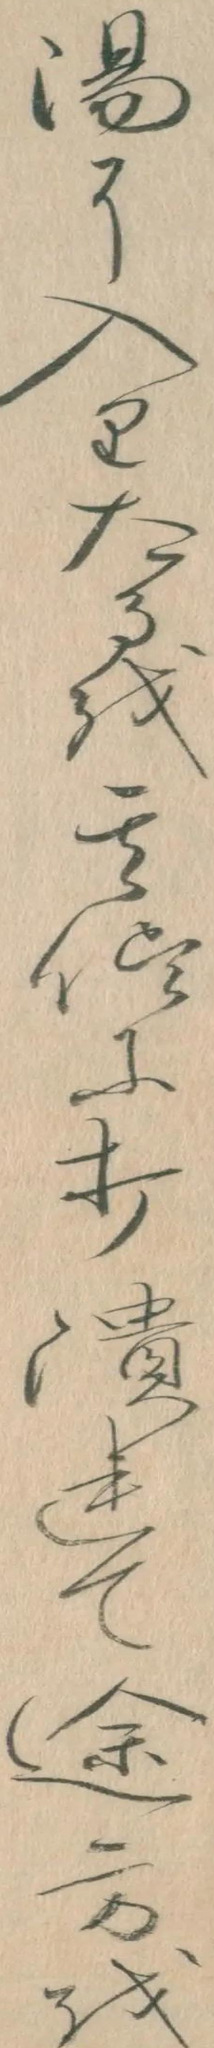湯に入りたるを其侭に打潰れて途方を
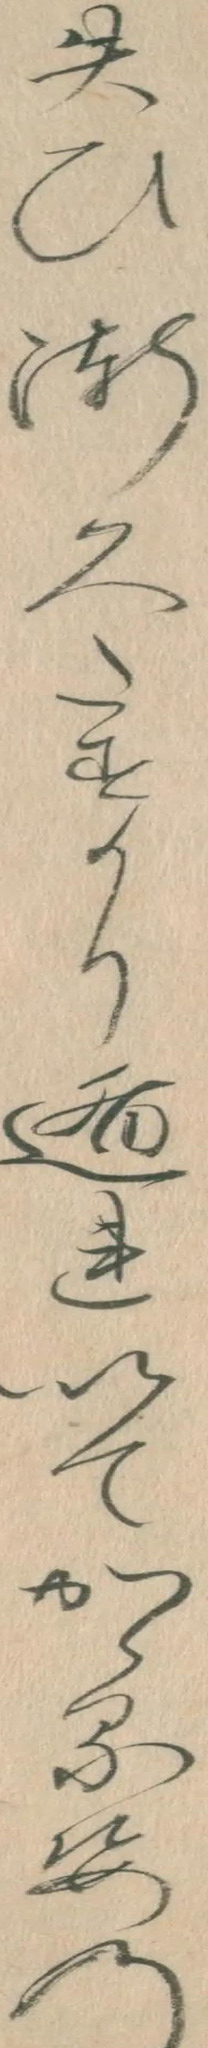失ひ漸くたすかり遁れいてかゝる姿の
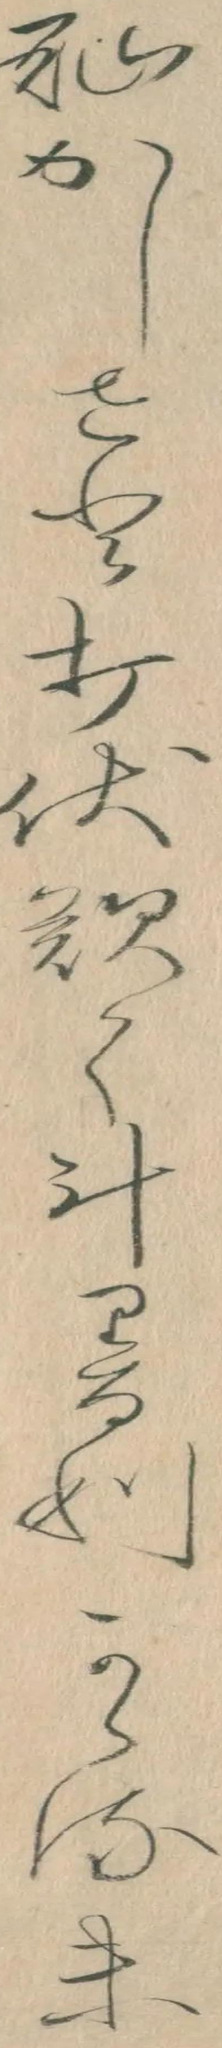恥かしさと打伏歎く計りなりかゝる未

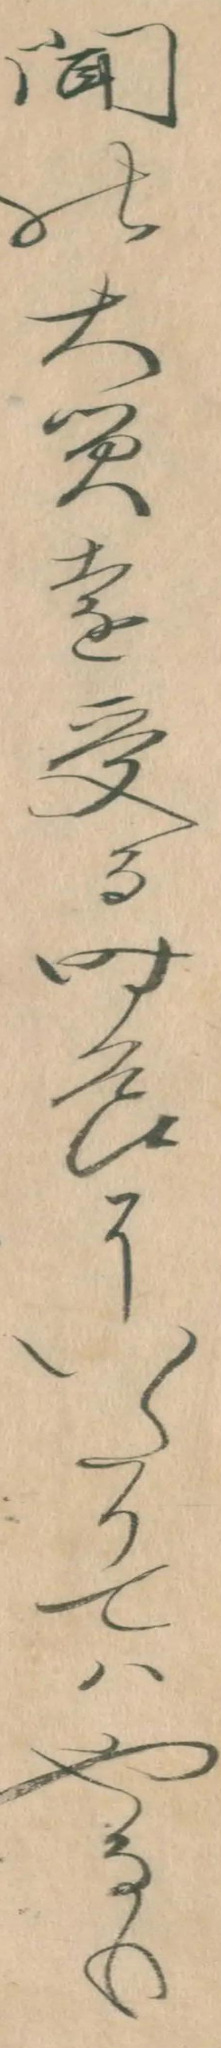聞の大災を受る時節にいたりてはやるも
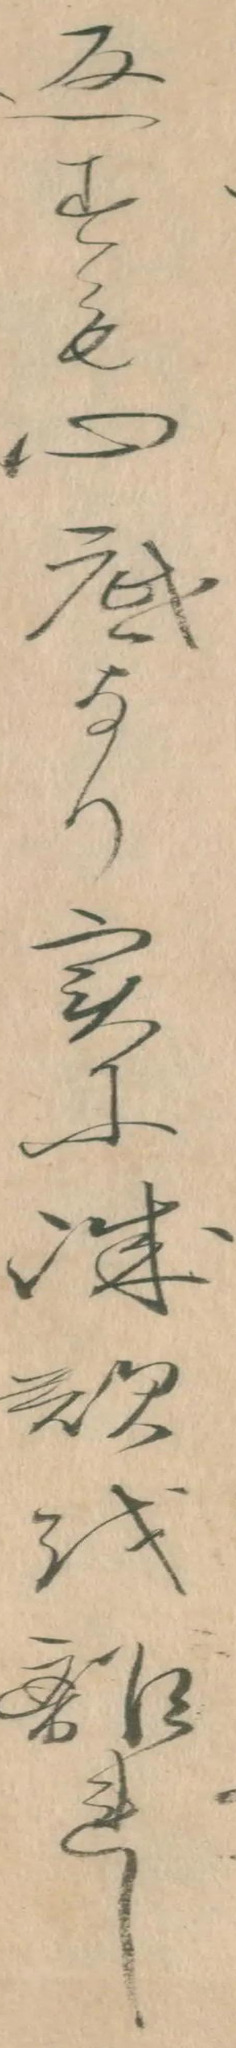返すも心底なり実に誠欲を離れし
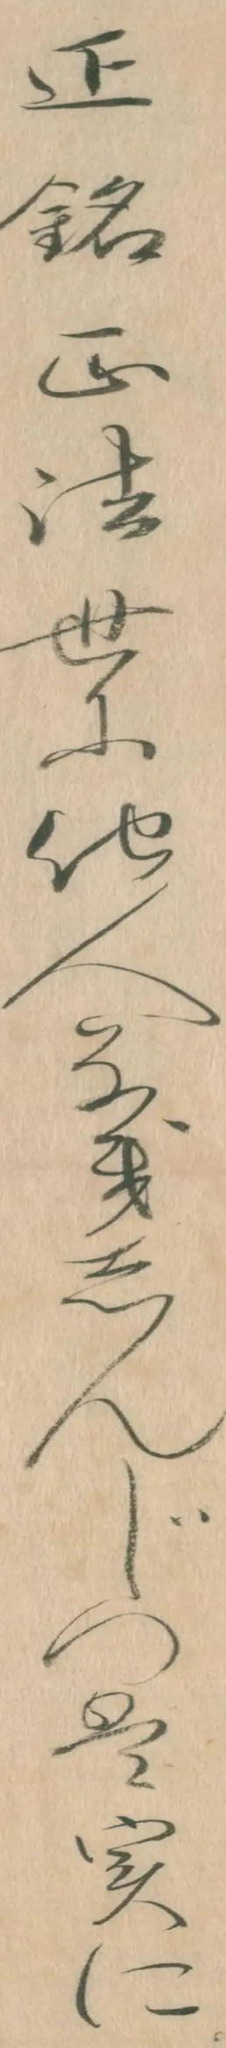正銘正法世に他人なきしんじつ是実に
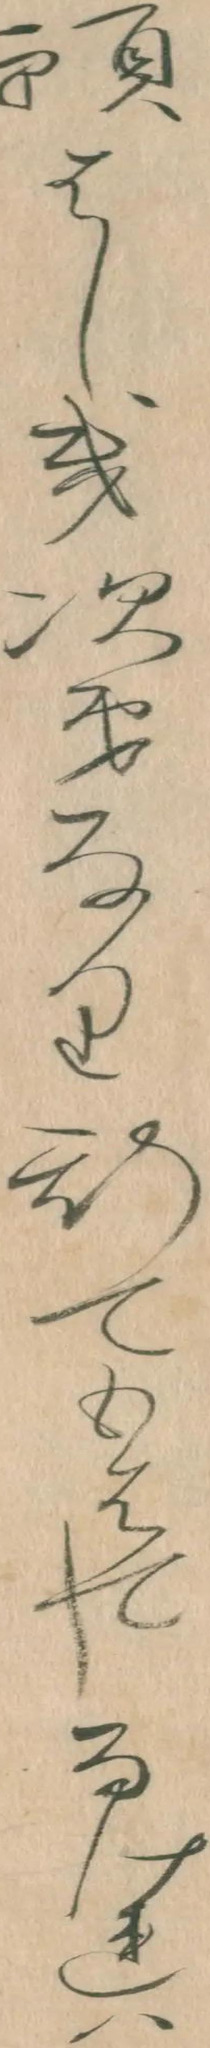願はしき次第なり斯てもはてしなけれは
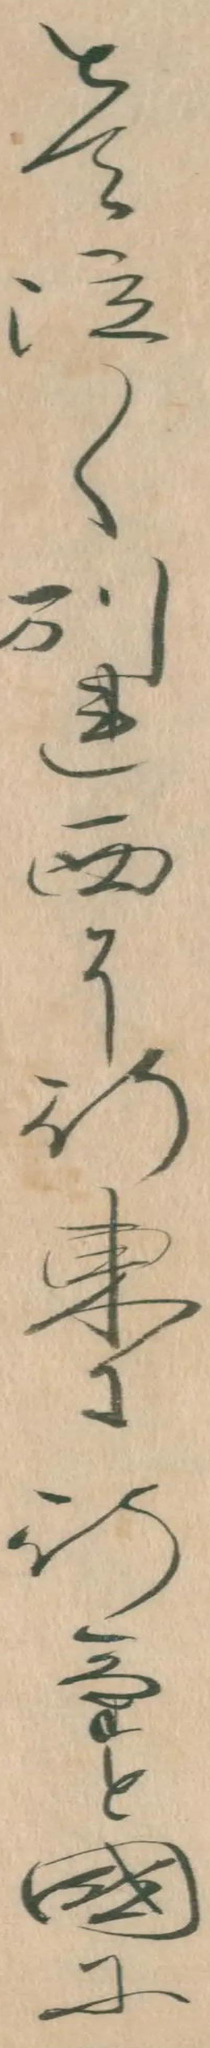とて泣〳〵別れ西に行東に行けと国に
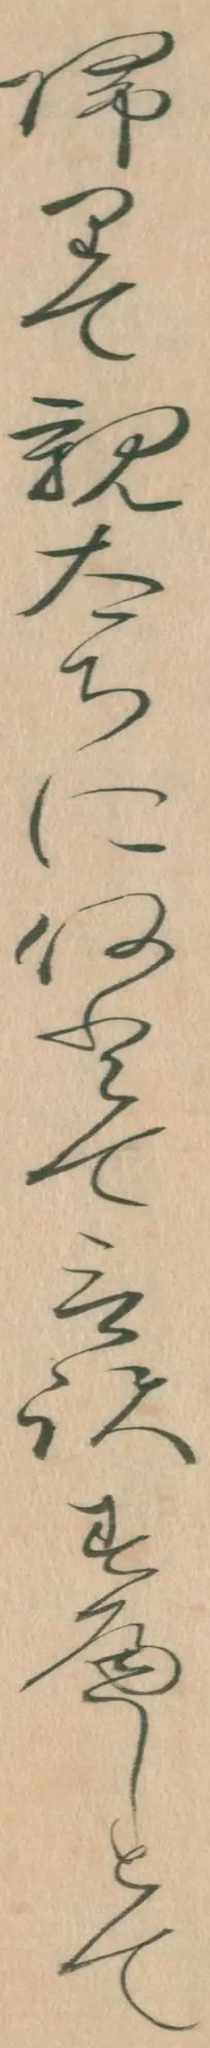帰りて親たちに何とて言訳すへしとて
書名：俗語之種. [4]
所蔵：国立国会図書館 National Diet Library, JAPAN
